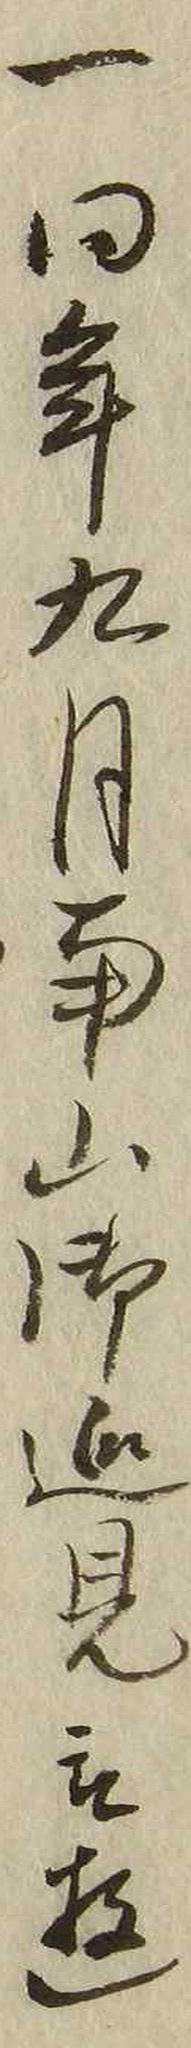一同年九月南山御巡見被遊
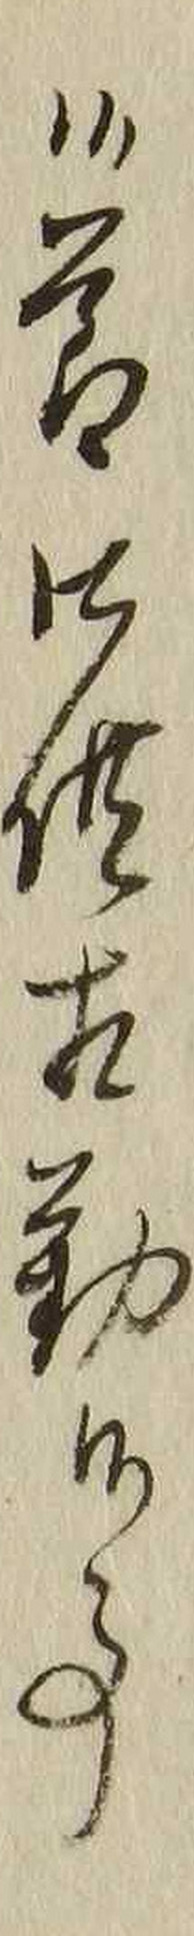候節御供相勤候事
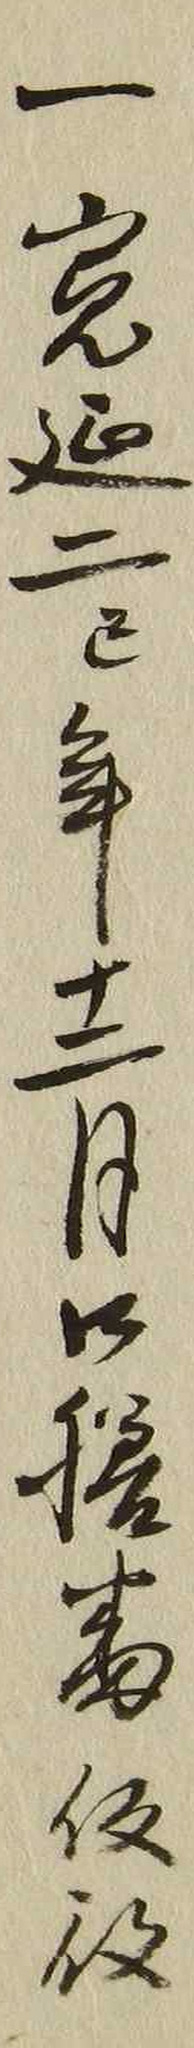一寛延二巳年十二月御膳番仮役
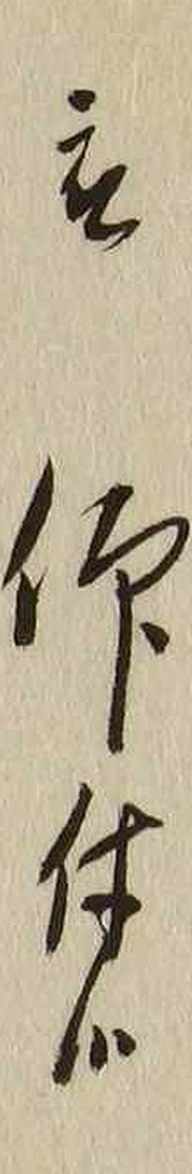被仰付候
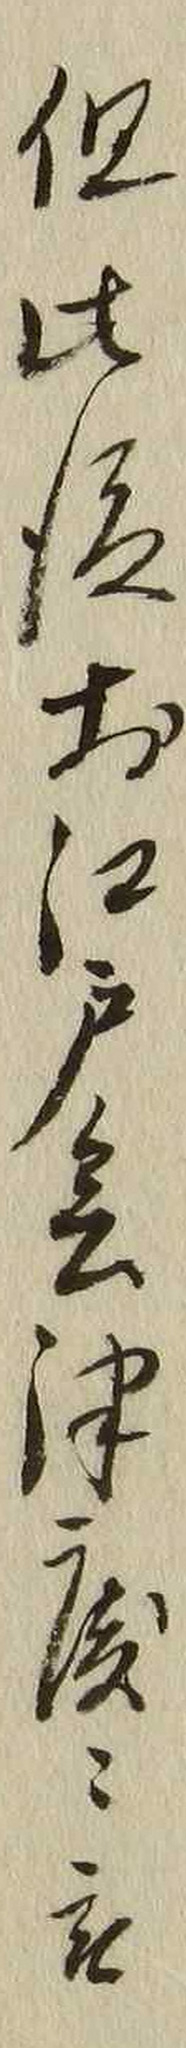但此後於江戸会津度々被
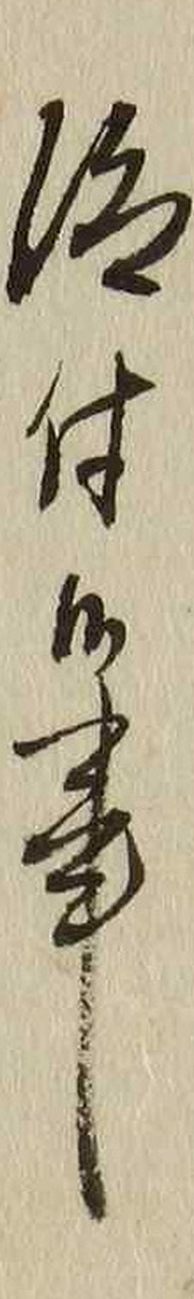仰付候事
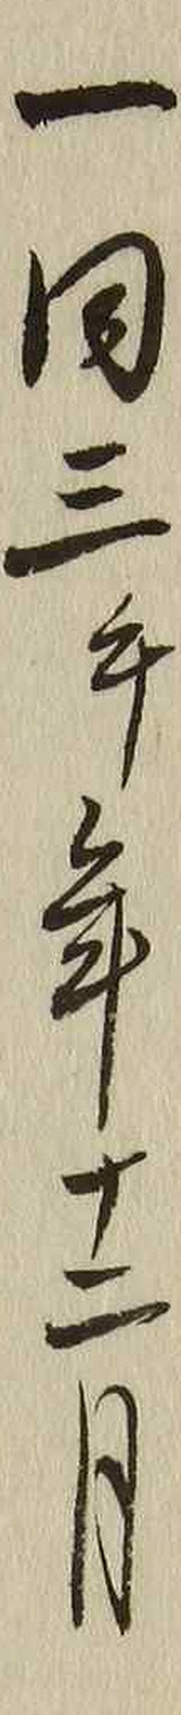一同三午年十二月
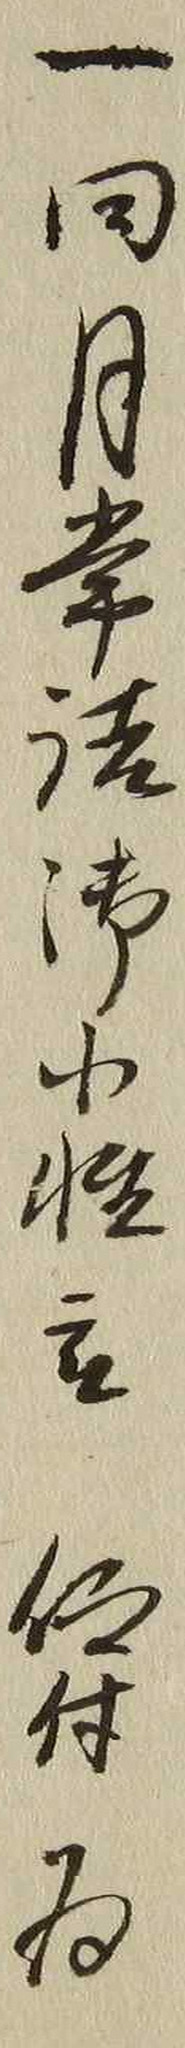一同月常詰御小性被位付為
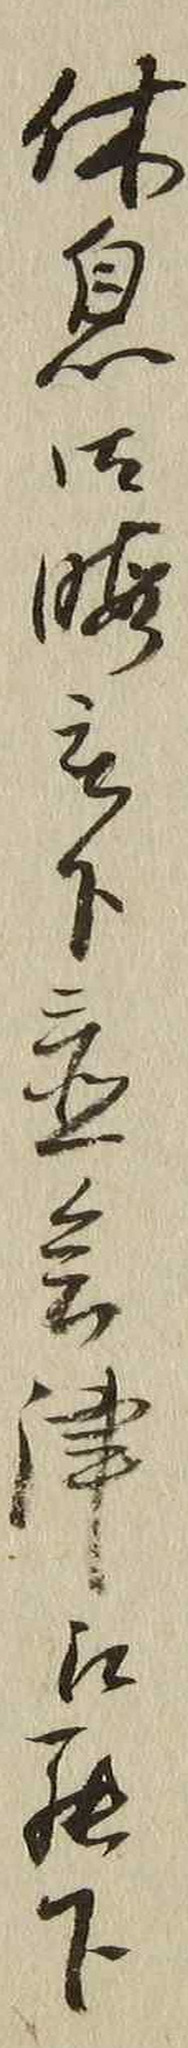休息御暇被下置会津江罷下
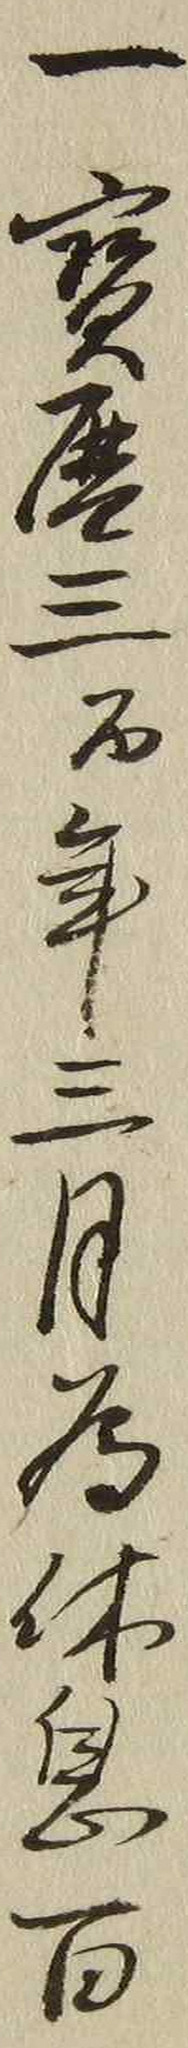一宝暦三酉年三月為休息百
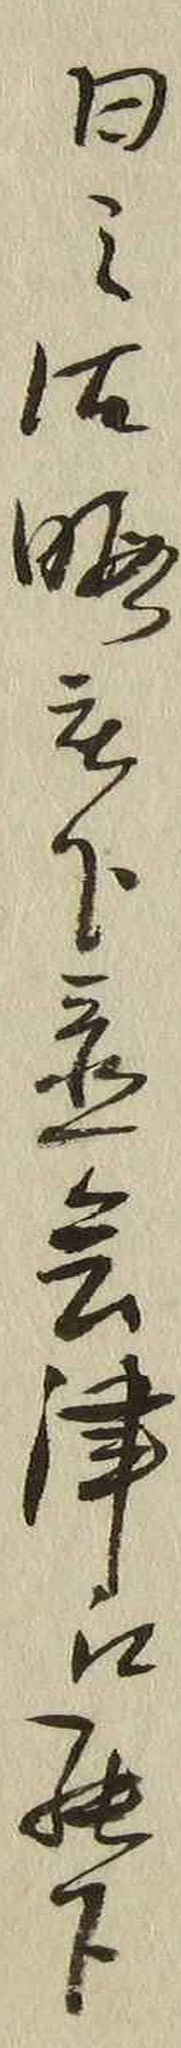日之御暇被下置会津江罷下
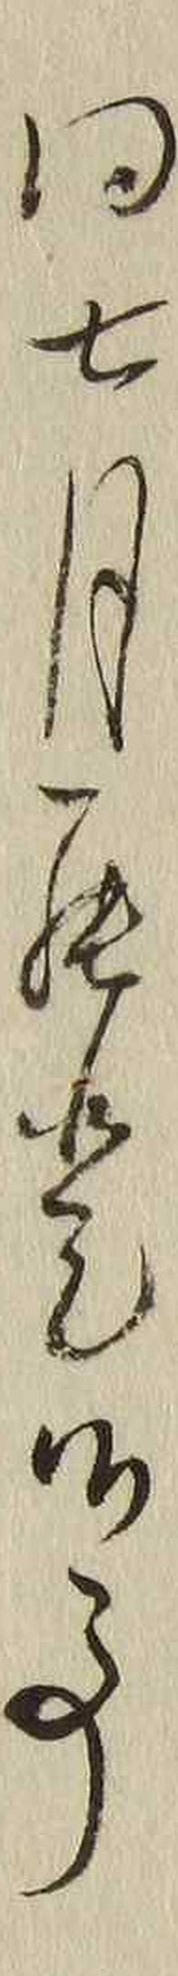同七月罷登候事
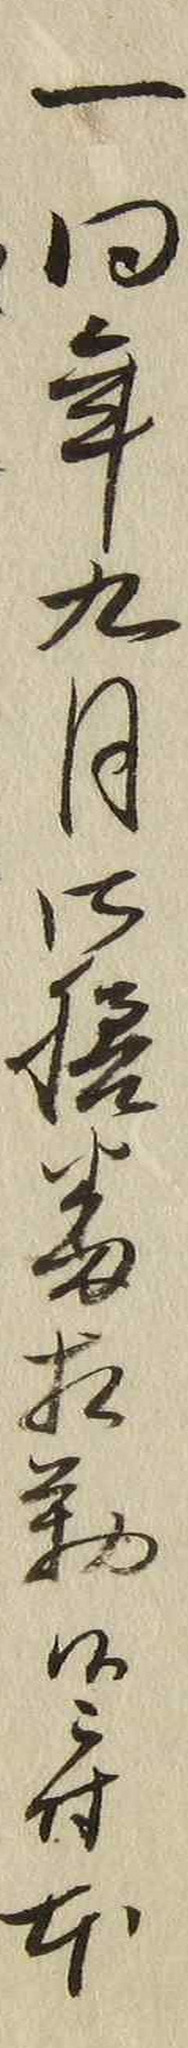一同年九月御膳番相勤候ニ付本
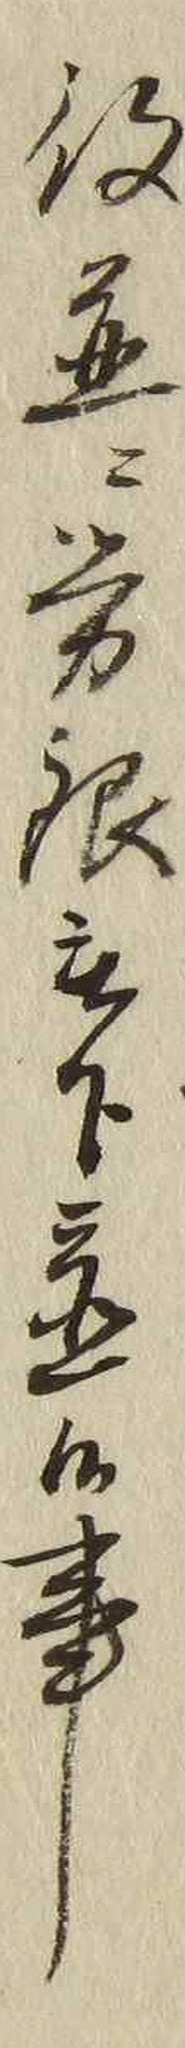役並ニ労銀被下置候事
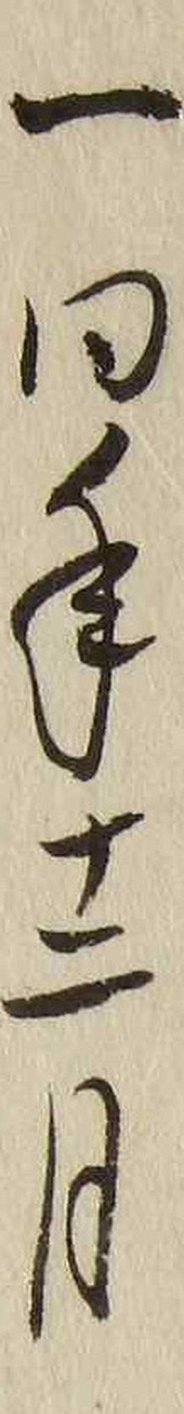一同年十二月
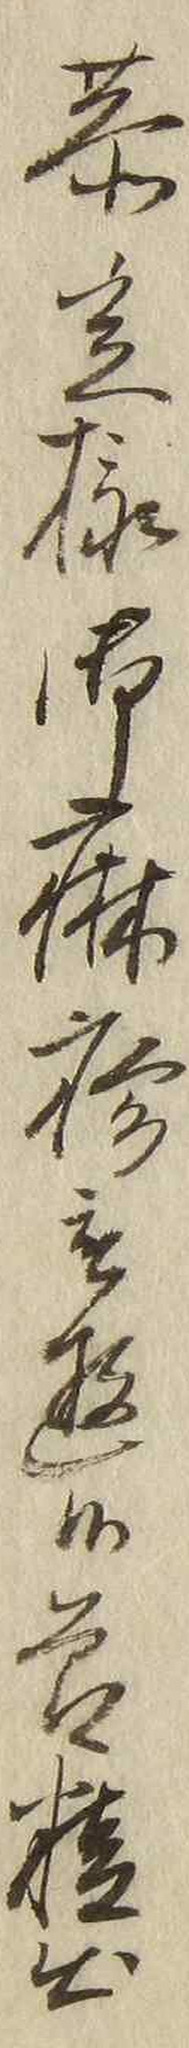恭定様御麻疹被遊候節精出
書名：諸士系譜　巻之359　す之部9
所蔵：会津若松市立会津図書館
